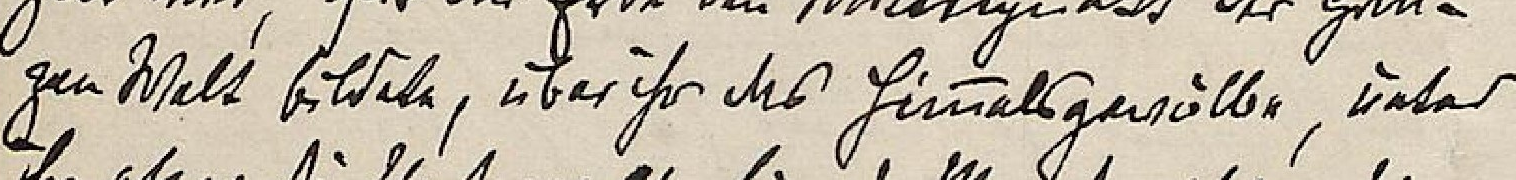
zen Welt bildete, über ihr das Himmelsgewölbe, unter
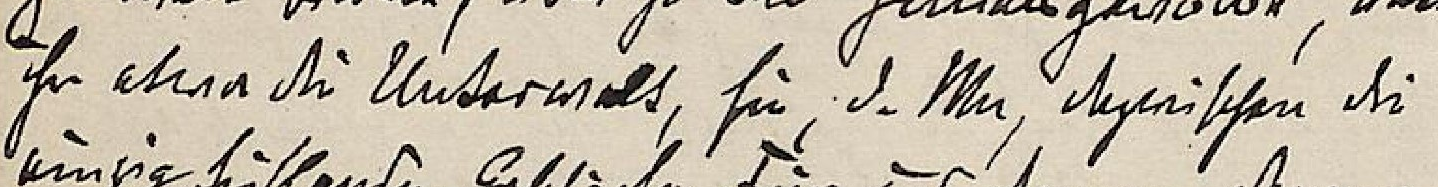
ihr etwa die Unterwelt, sie, d. Mn., dazwischen die
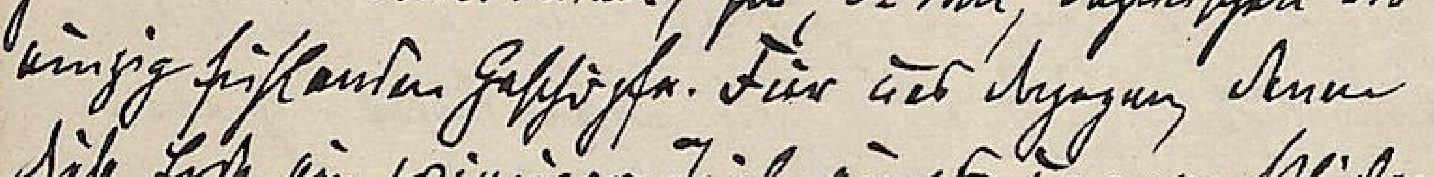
einzig fühlenden Geschöpfe. Für uns dagegen, denen
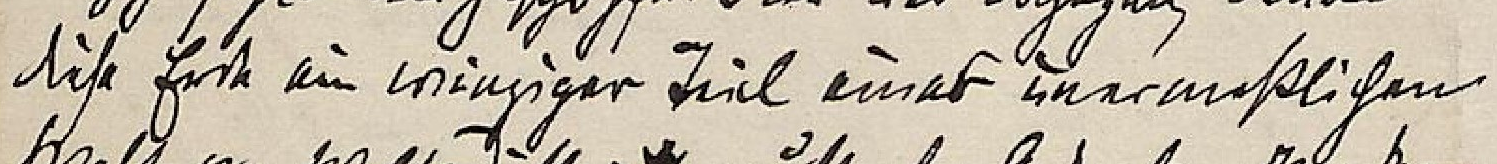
diese Erde ein winziger Teil einer unermeßlichen
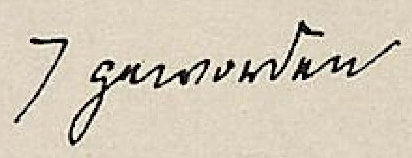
geworden
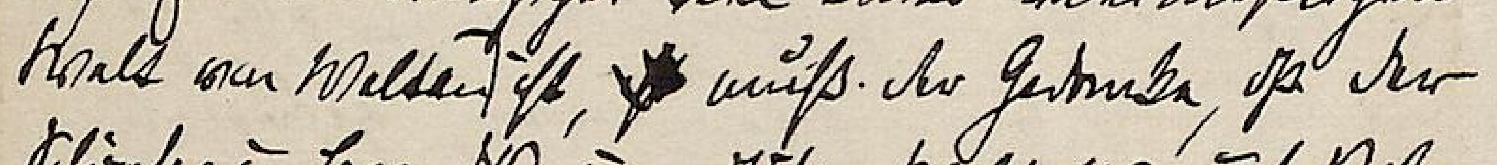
Welt von Welten ist, ist muß der Gedanken, daß der
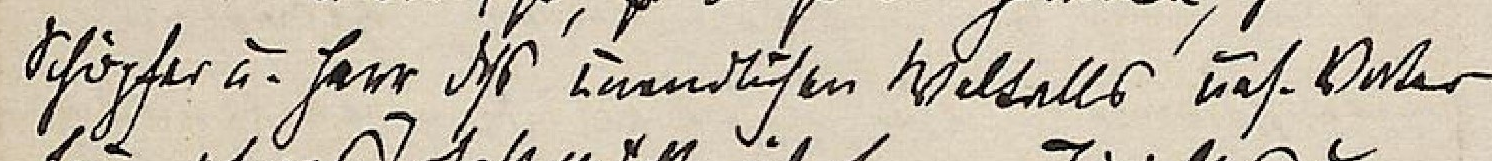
Schöpfer u. Herr diss unendlichen Weltalls unser Vater
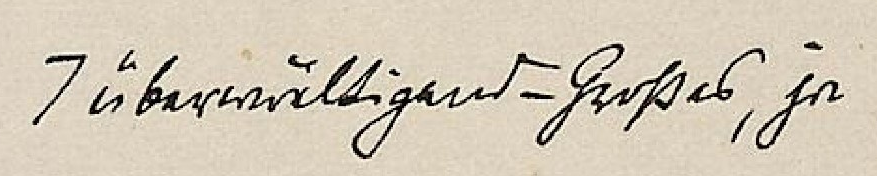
] überwältigend-Großes, ja
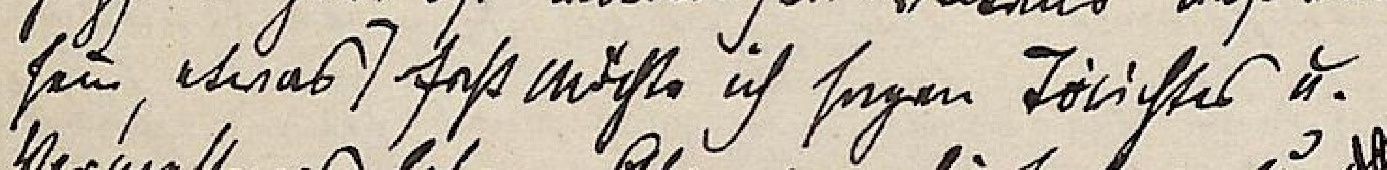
sein, etwas] fast möchte ich sagen, Törichtes u.
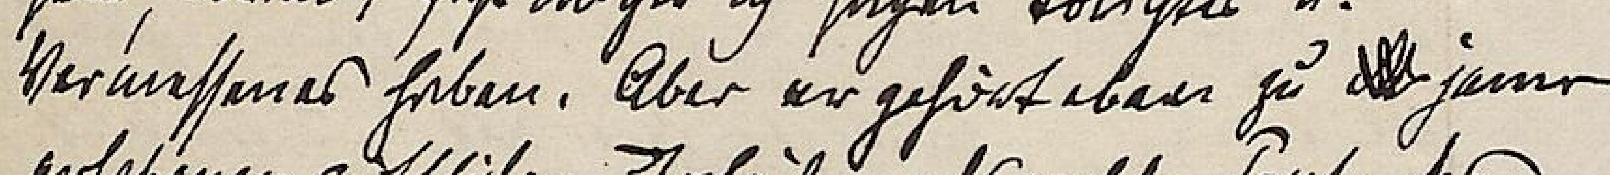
Vermessenes haben. Aber er gehört eben zu der jener
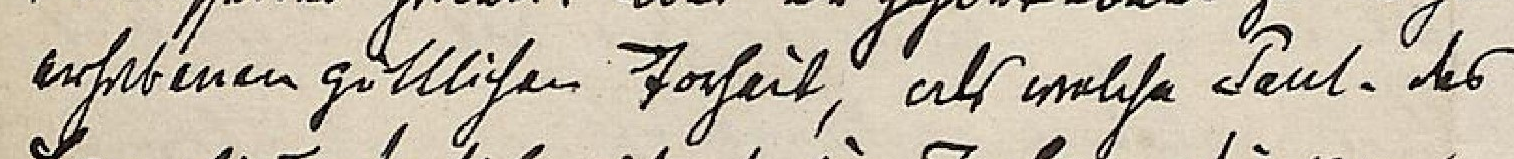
erhabenen göttlichen Torheit, als welche Paul. das
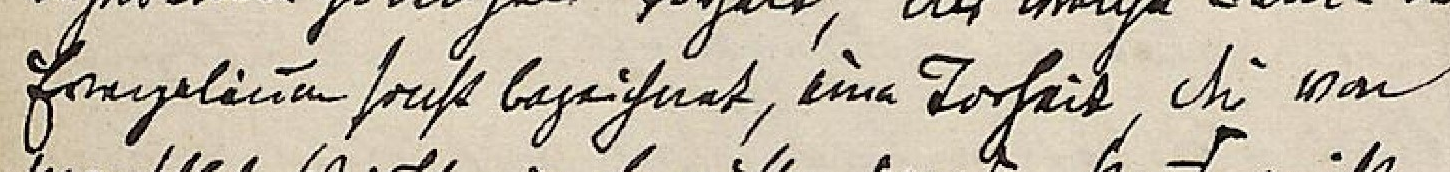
Evangelium sonst bezeichnet, eine Torheit, die von
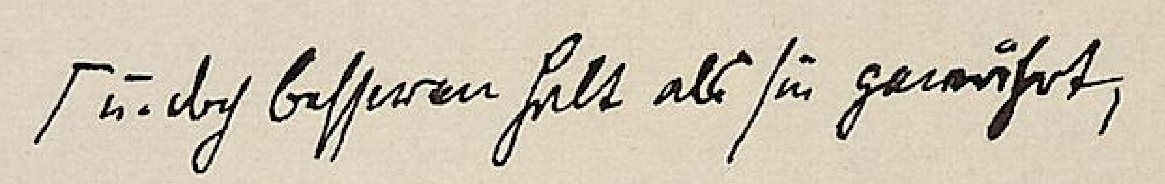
[ u. doch besseren Halt als sie gewährt,
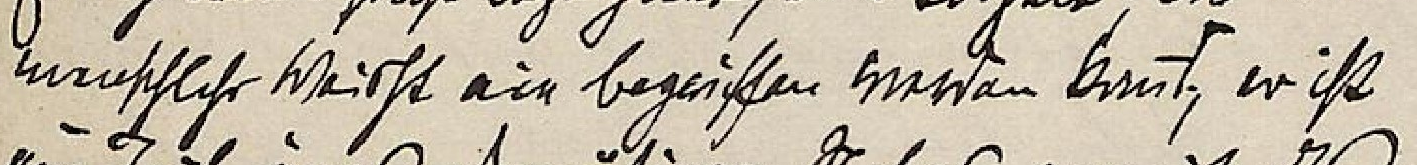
menschlchr Weisht ein begriffen werden kann [; er ist
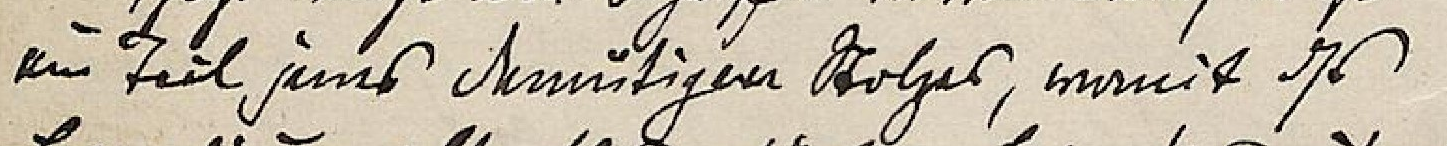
ein Teil jenes demütigen Stolzes, womit dss
